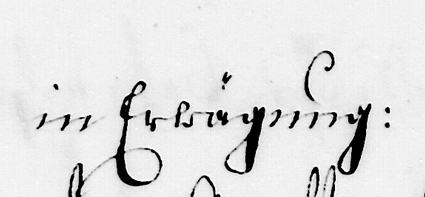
in Erwägung:
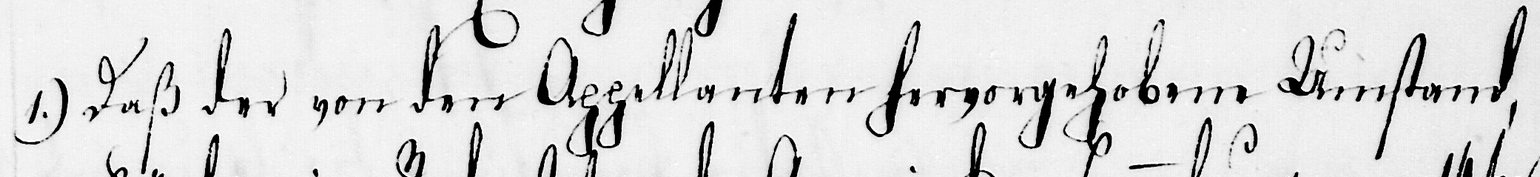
1.) Daß der von den Appellanten hervorgehobene Umstand,
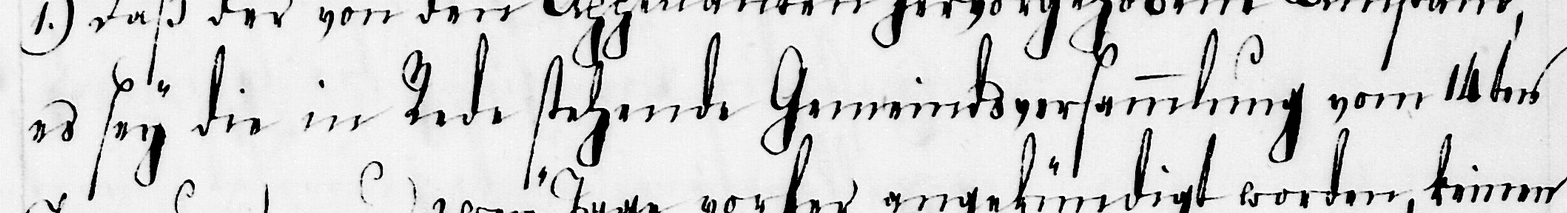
es sey die in Rede stehende Gemeindsversammlung vom 14ten
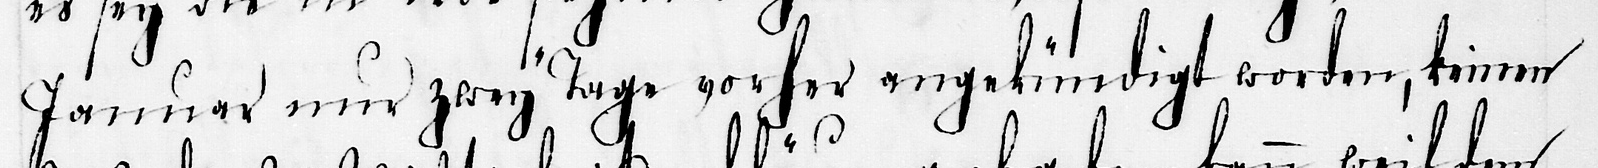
Januar nur zwey Tage vorher angekündigt worden, keinen
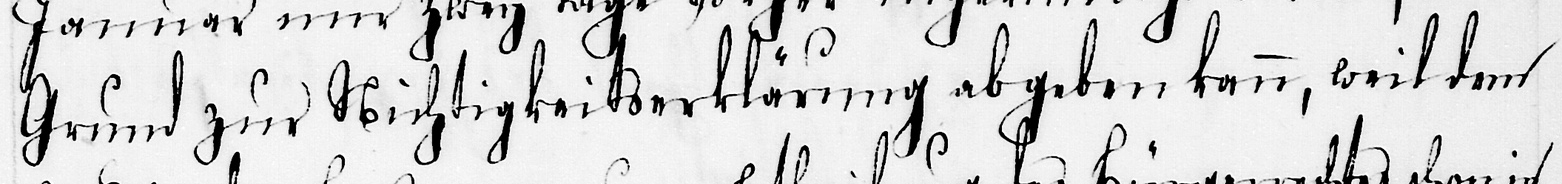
Grund zur Nichtigkeitserklärung abgeben kann, weil dem
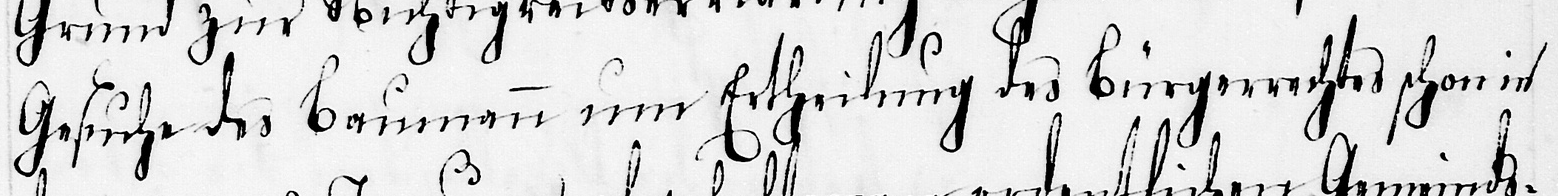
Gesuche des Baumann um Ertheilung des Bürgerrechtes schon in
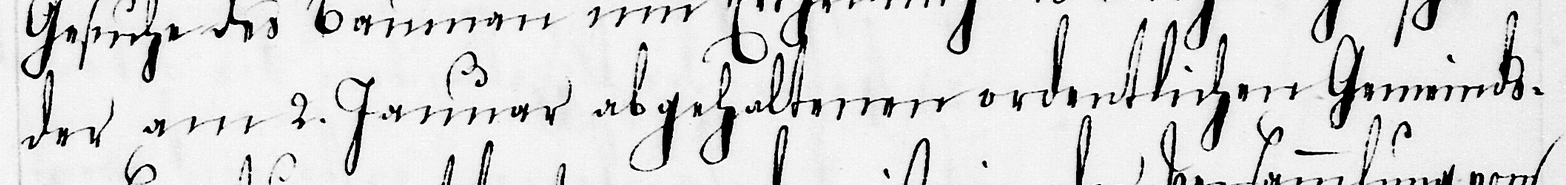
der am 2. Januar abgehaltenen ordentlichen Gemeinds¬
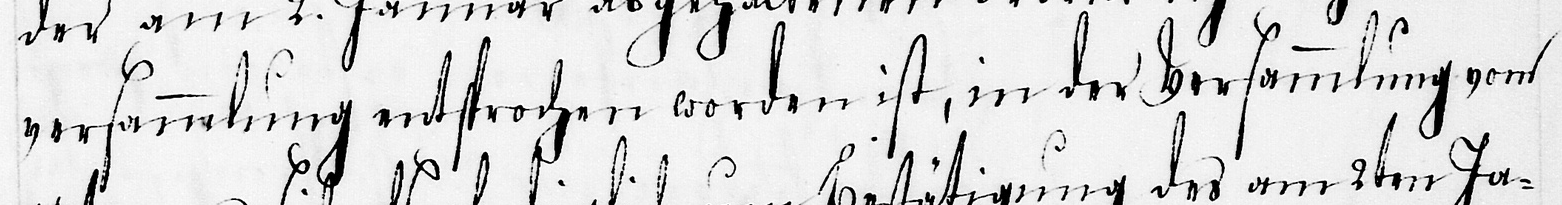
versammlung entsprochen worden ist, in der Versammlung vom
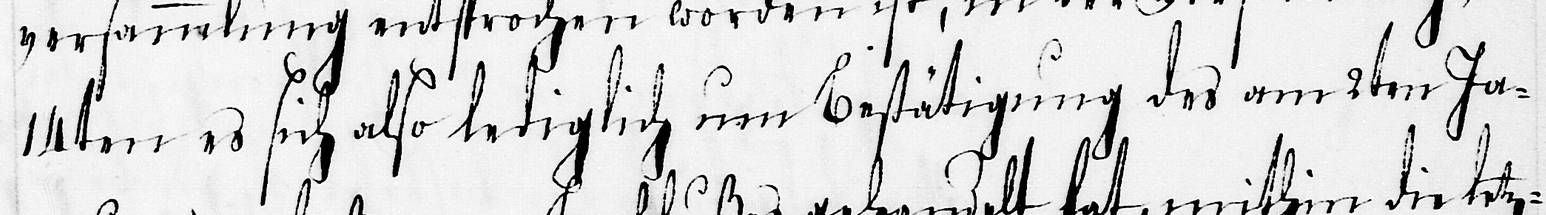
14ten es sich also lediglich um Bestätigung des am 2ten Ja¬
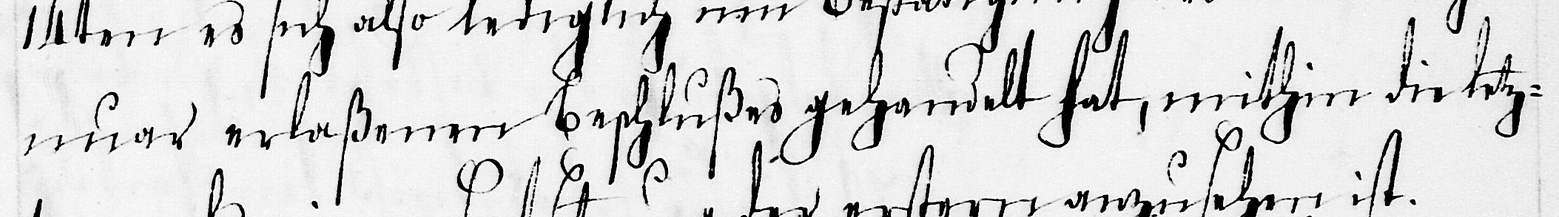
nuar erlaßenen Beschlußes gehandelt hat, mithin die letz¬
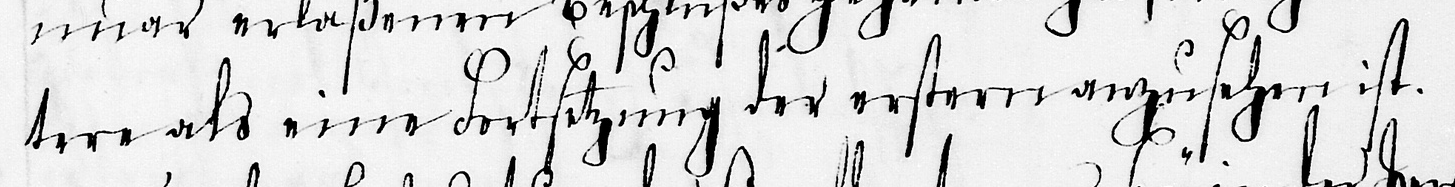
tere als eine Fortsetzung der erstern anzusehen ist.
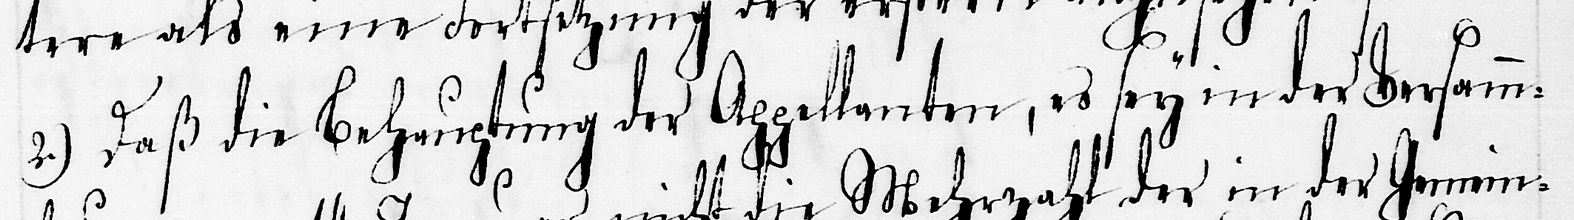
2.) Daß die Behauptung der Appellanten, es sey in der Versamm¬
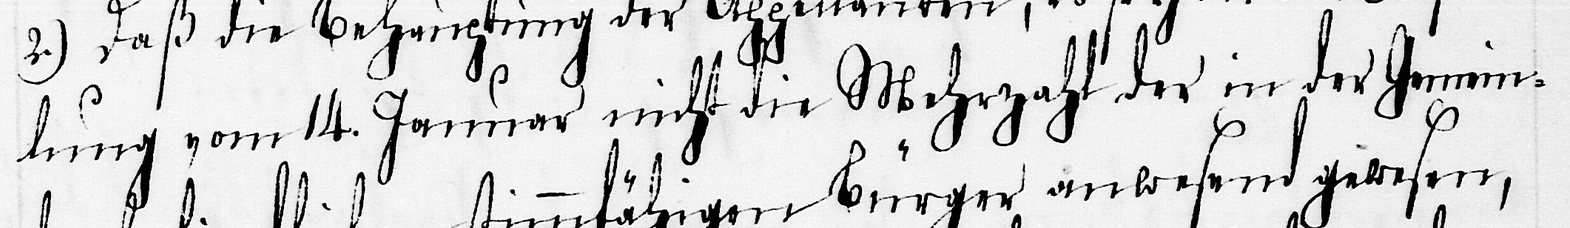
lung vom 14. Januar nicht die Mehrzahl der in der Gemein¬
